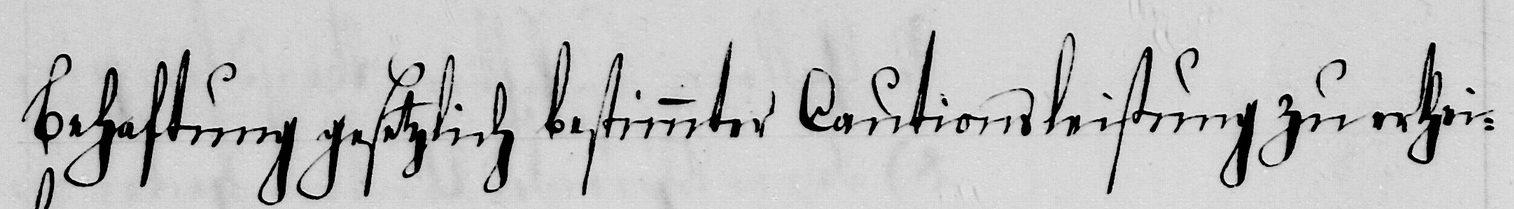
Behaftung gesetzlich bestimmter Cautionsleistung zu erthei¬
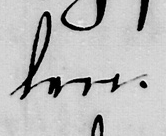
len.
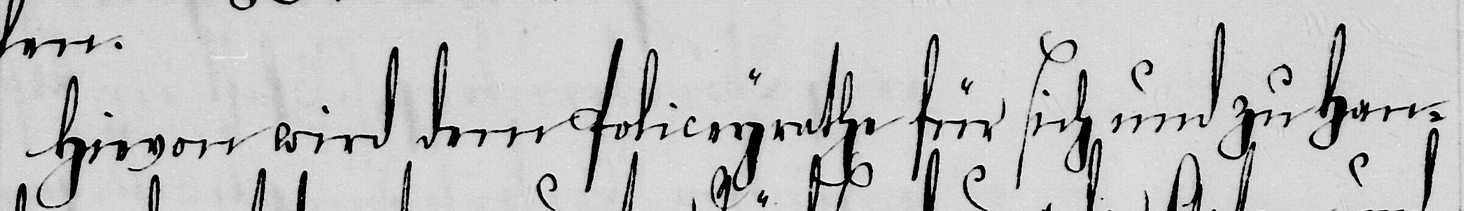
Hievon wird dem Policeyrathe für sich und zu Han¬
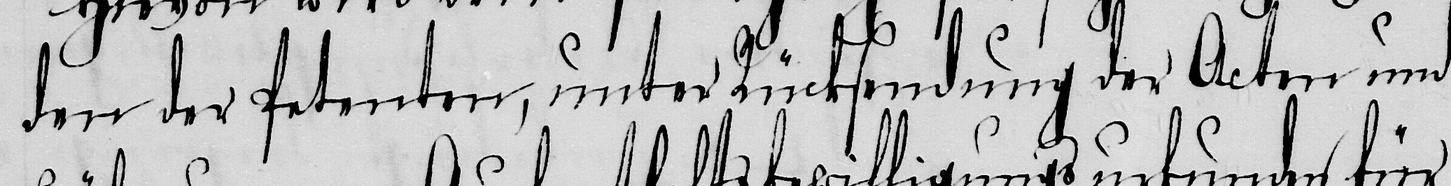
den der Petenten, unter Rücksendung der Acten und
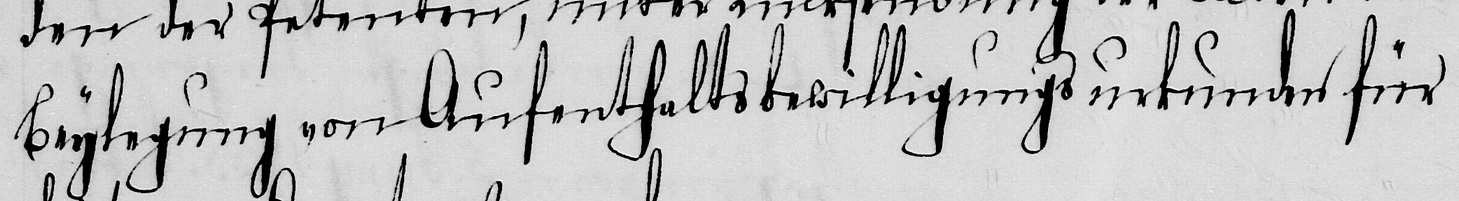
Beylegung von Aufenthaltsbewilligungsurkunden für
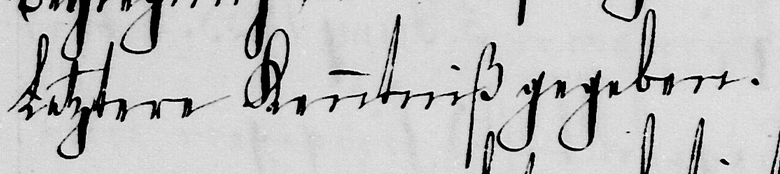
Letztere Kenntniß gegeben.
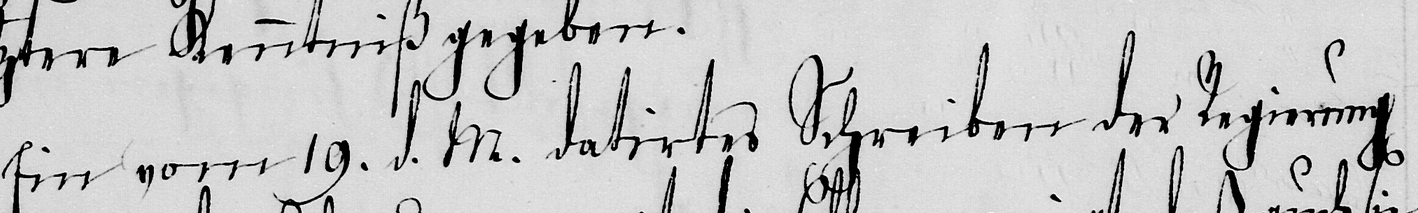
Ein vom 19. d. M. datirtes Schreiben der Regierung
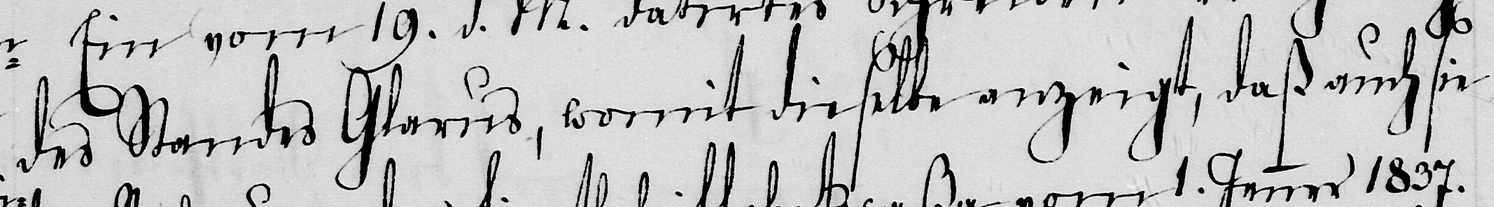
des Standes Glarus, womit dieselbe anzeigt, daß auch sie
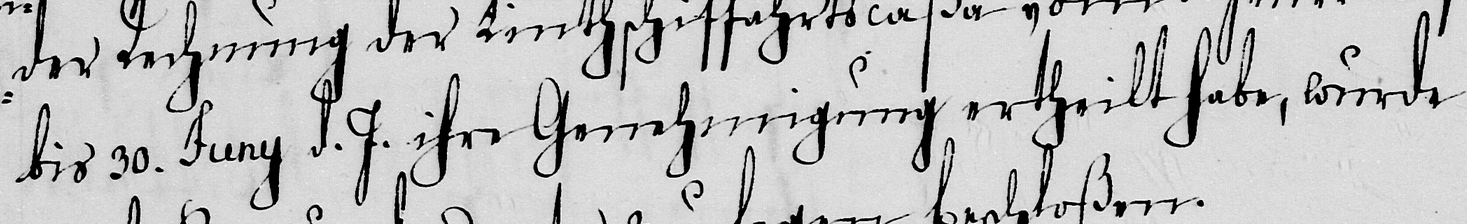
bis 30. Juny d. J. ihre Genehmigung ertheilt habe, wurde
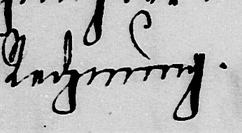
Rechnung
